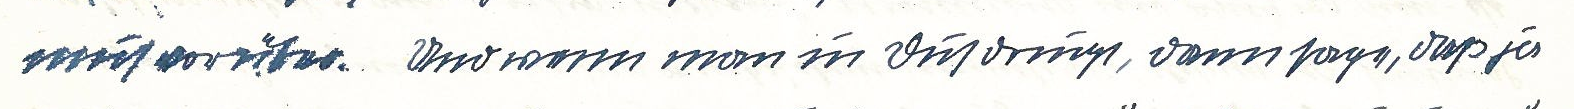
mich vorüber. Und wenn man in Dich dringt, dann sage, daß ja
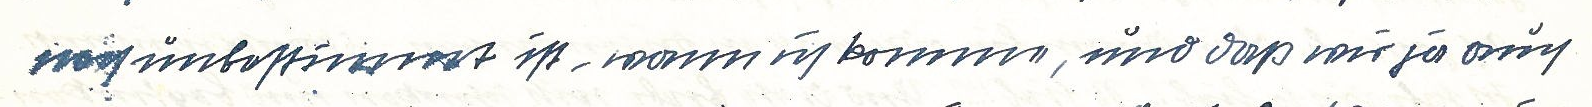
noch unbestimmt ist, wann ich komme, und daß wir ja auch
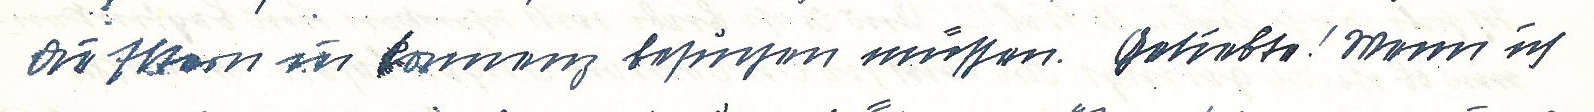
die Eltern in K. besuchen müssen. Geliebte! Wenn ich
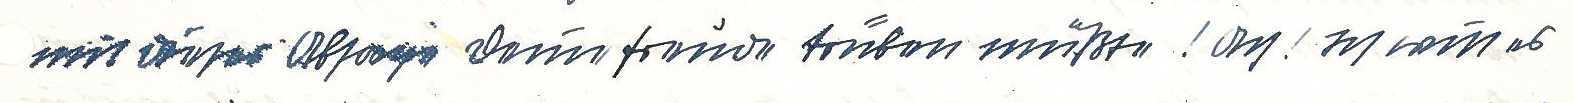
mit dieser Abfolge Deine Freude trüben mußte! Ach! Ich will es
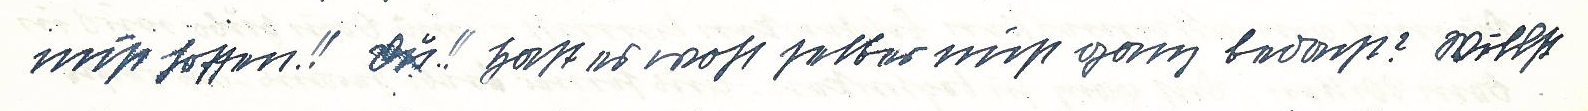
nicht hoffen!! Du!! Hast es wohl selber nicht ganz bedacht? Willst
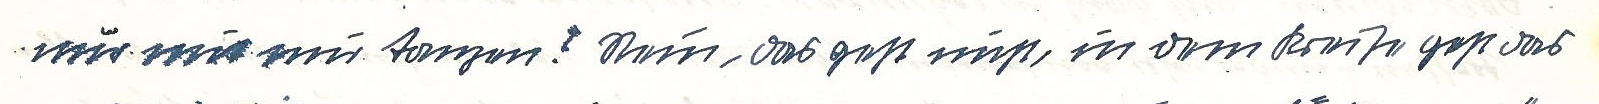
nur mit mir tanzen? Nein, das geht nicht, in dem Kreise geht das
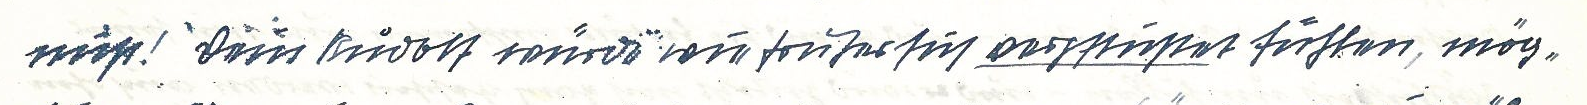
nicht! Dein würde wie früher sich verpflichtet fühlen, mög¬
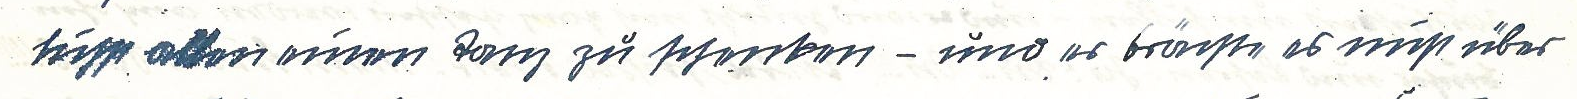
lichst allen einen Tanz zu schenken – und er brächte es nicht über
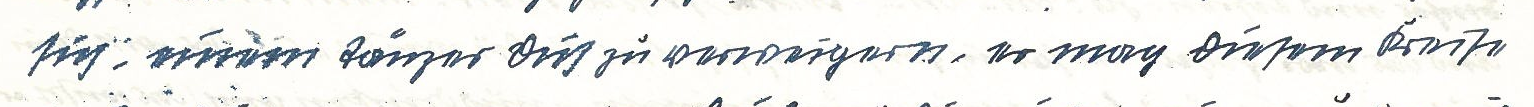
sich, einem Tänzer Dich zu verweigern, er mag diesem Kreise
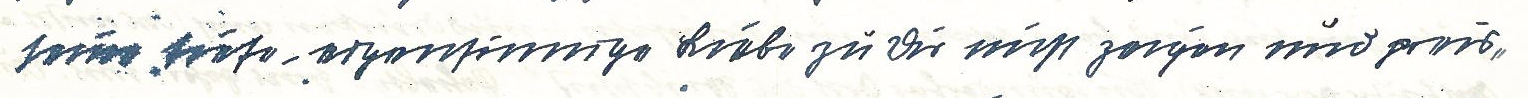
seine tiefe, eigensinnige Liebe zu Dir nicht zeigen und preis¬
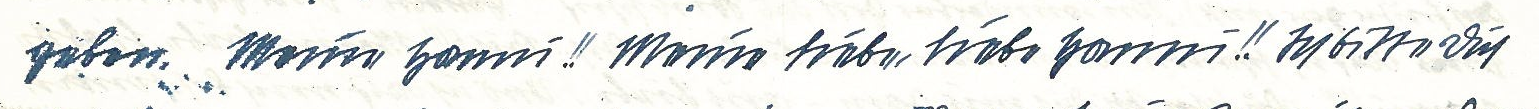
geben. Meine !! Meine liebe, liebe !! Ich bitte Dich
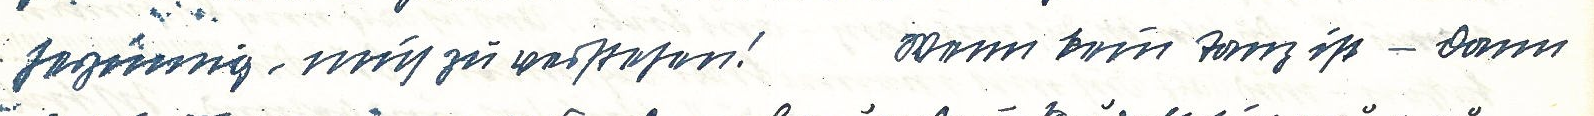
herzinnig, mich zu verstehen! Wenn kein Tanz ist – dann
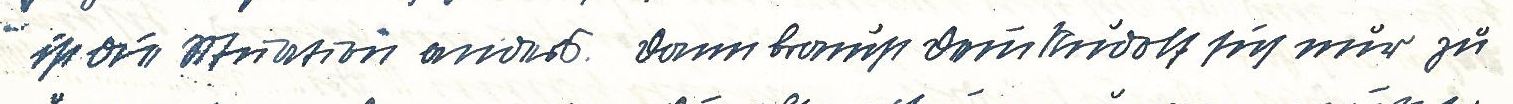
ist die Situation anders. Dann braucht Dein sich nur zu
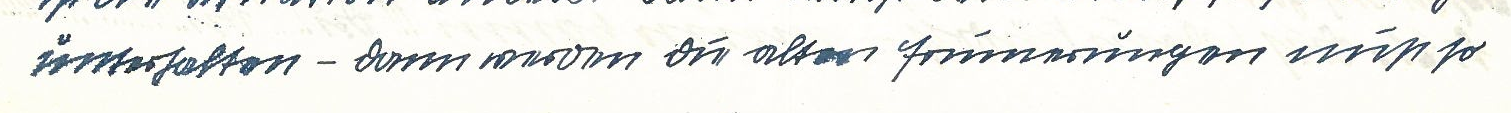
unterhalten – dann werden die alten Erinnerungen nicht so
